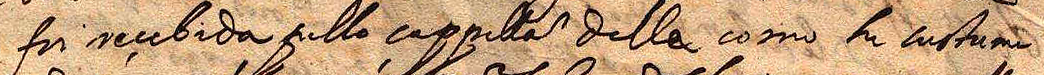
foi recebida pello cappellaõ delle como he custume
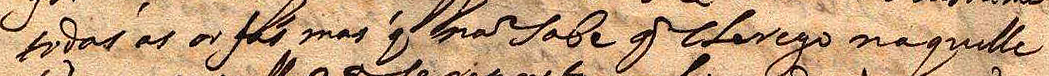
todas as orfas̄ mas q̄ naõ sabe q̄ clerigo naquelle
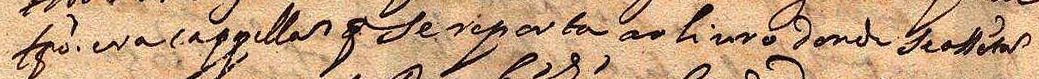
tpō. era cappellaõ q̄ se reporta ao liuro donde se assēta
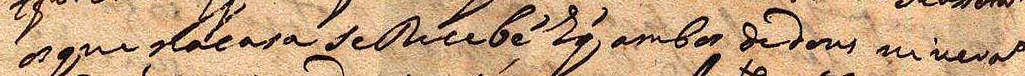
os que na casa se Recebē, E q̄ ambos de dous uiueraõ
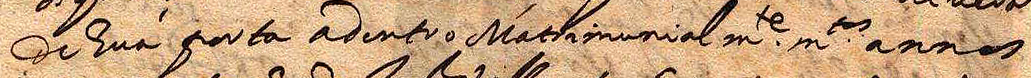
de huā porta a dentro Matrimonialm.te m.tos annos
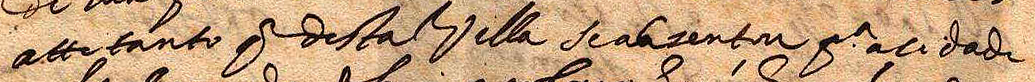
atte tanto q̄ desta Villa se abzentou p.a a cidade
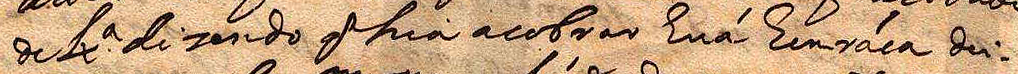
de Lxa. dizendo q̄ hia a cobrar huā henrāça dei
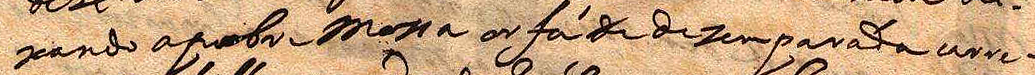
xando a pobre mossa orfā de dezemparada carre
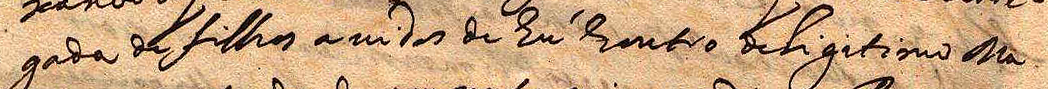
gada de filhos auidos de hū houtro de ligitimo Ma
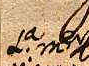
1.a m.er
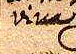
viua
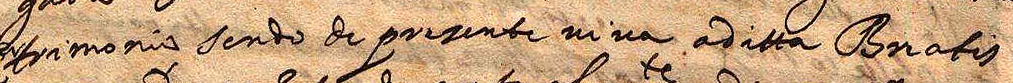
trimonio sendo de prezente uiua a ditta Briatis
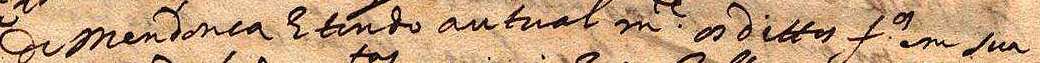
de mendonça E tendo autualm.te os dittos fos em sua
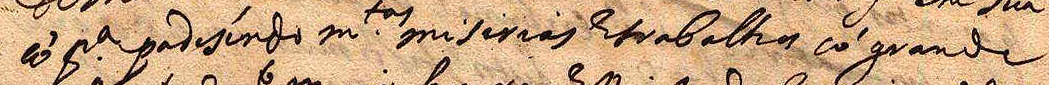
cōp.a padesendo m.tas miserias E trabalhos cō grande
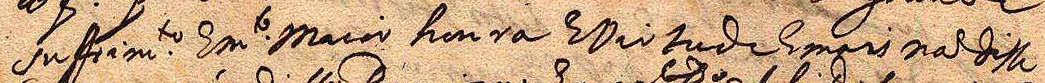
suffrim.to E m.to maior honra E Virtude E mais naõ disse
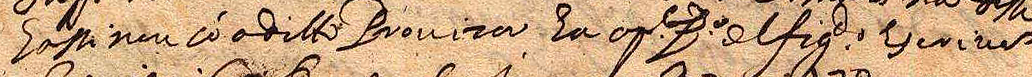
E assinou cō o ditto Prouizor Eu o p.e P.o de fig.do Escreuaõ
